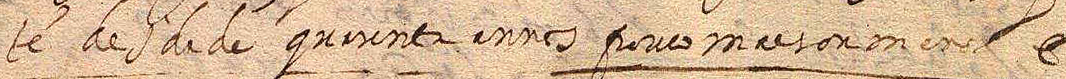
tē de jdade quarenta annos pouco maes ou menos &
